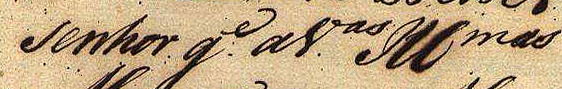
senhor g.e a V.as Ill.mas
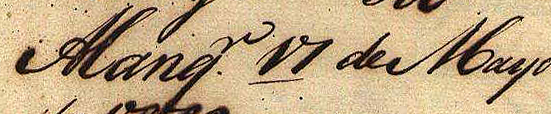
Alanq.r 17 de Mayo
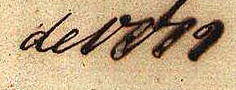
de 1779
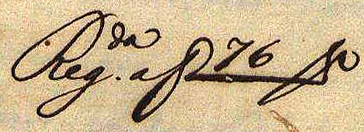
Reg.da a fl 76 v
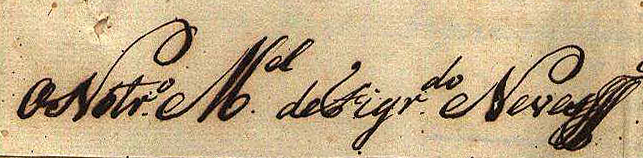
o Notr.o M.el de Figr.do Neves
